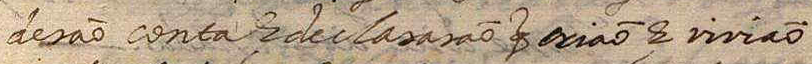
deraõ conta, E declararaõ q̄ criaõ, E viviaõ
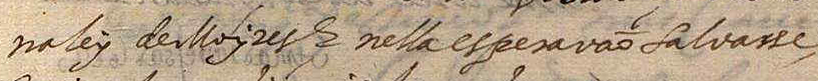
na ley de Moyzes, E nella esperavaõ salvarse,
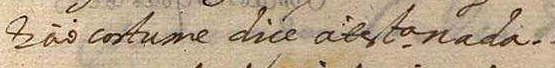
E ao costume dice, a test.a nada.
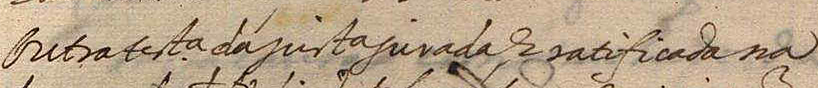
Outra test.a da justa jurada, E ratificada na
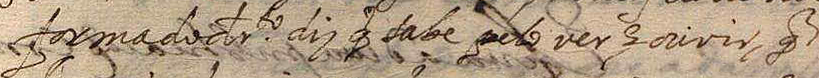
forma do d̄r.to diz q̄ sabe pelo ver, E ouvir, q̄
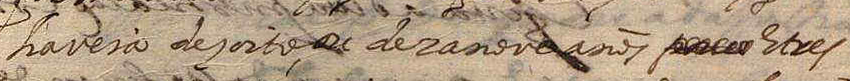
havera dezoito, ou dezanove anōs _ E tres
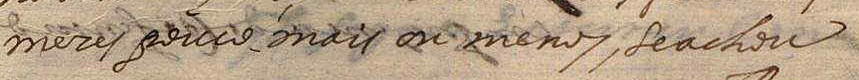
mezes pouco mais ou menos, se achou
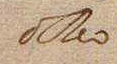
o Reo
